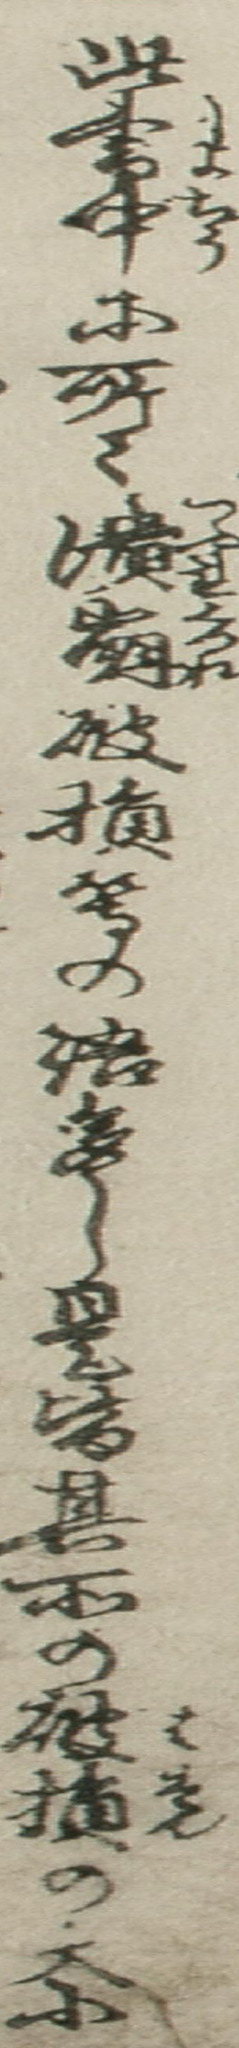一此書中に所〻潰崩破損等の語多し是皆其所の破損の大小
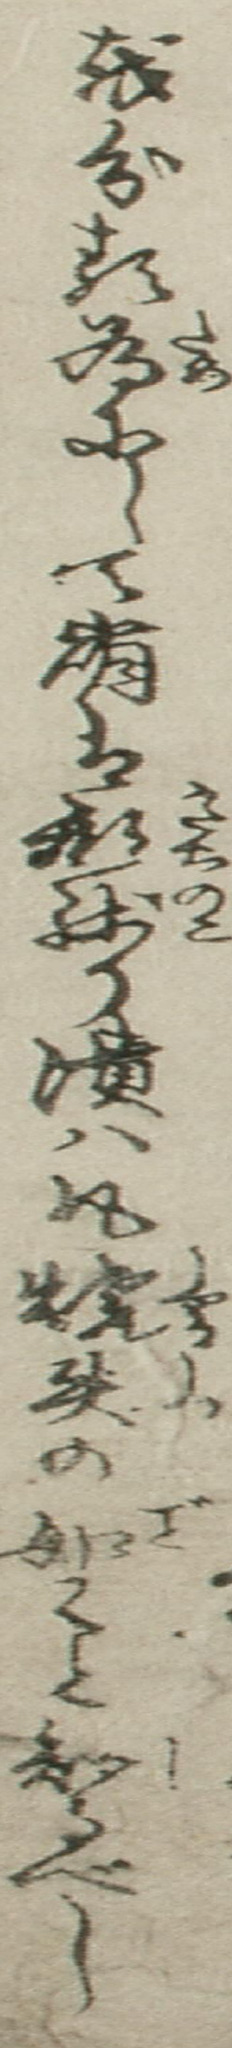を分る為にして崩は形残り潰は凡焼失の如くと知るべし

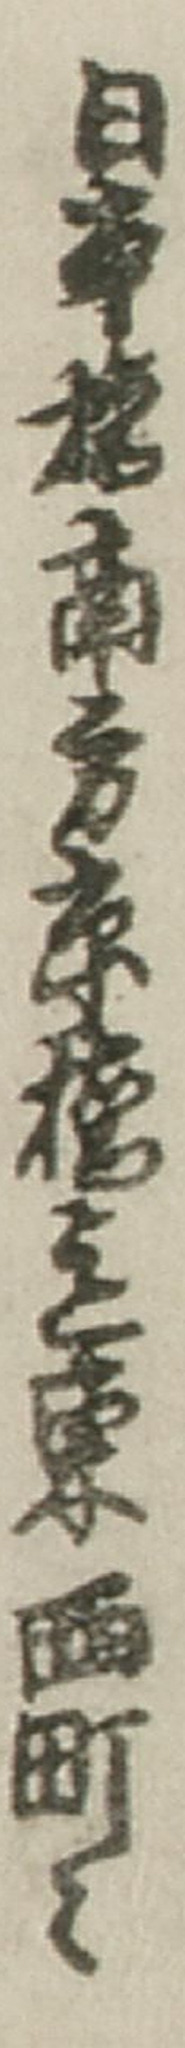壱日本橋南方京橋迄東西町〻
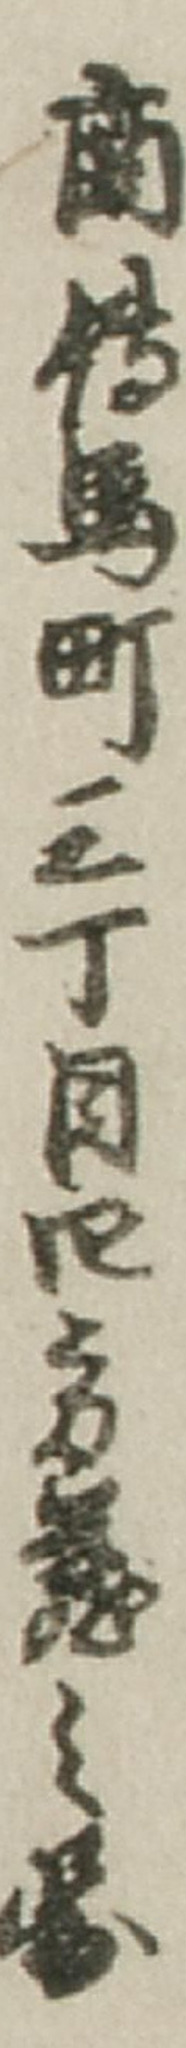南伝馬町三丁目四方蔵之図
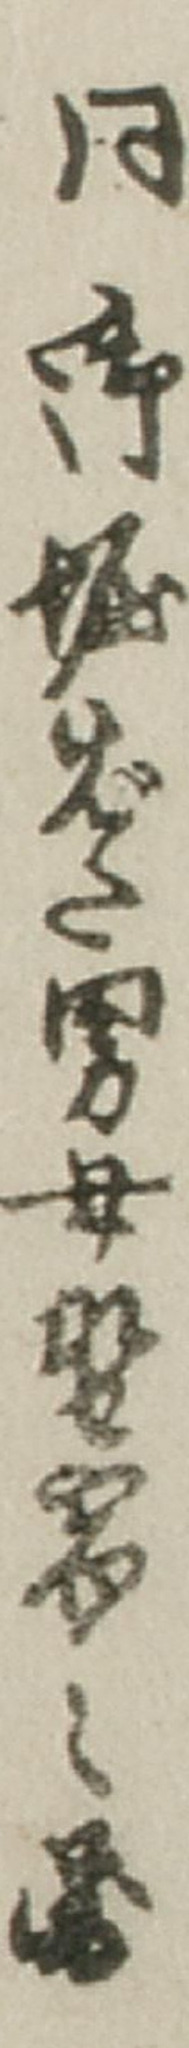同御堀ばた男女野宿之図
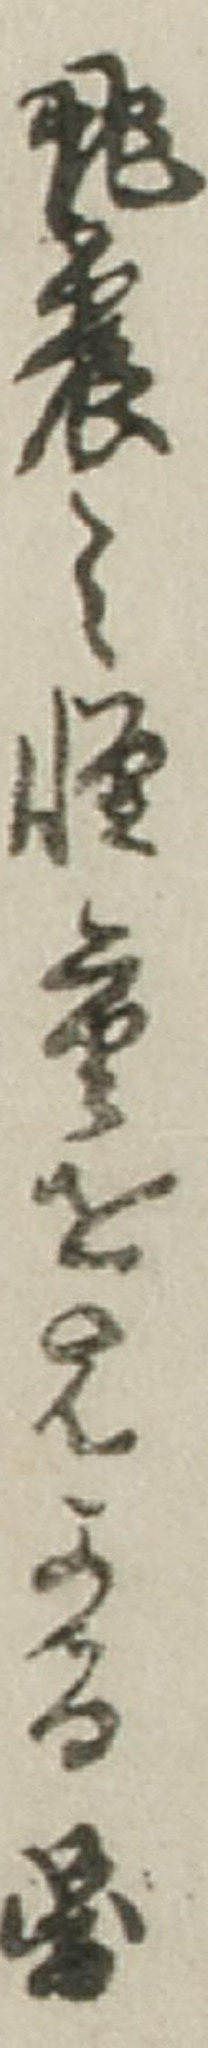地震之軽重をはかる図
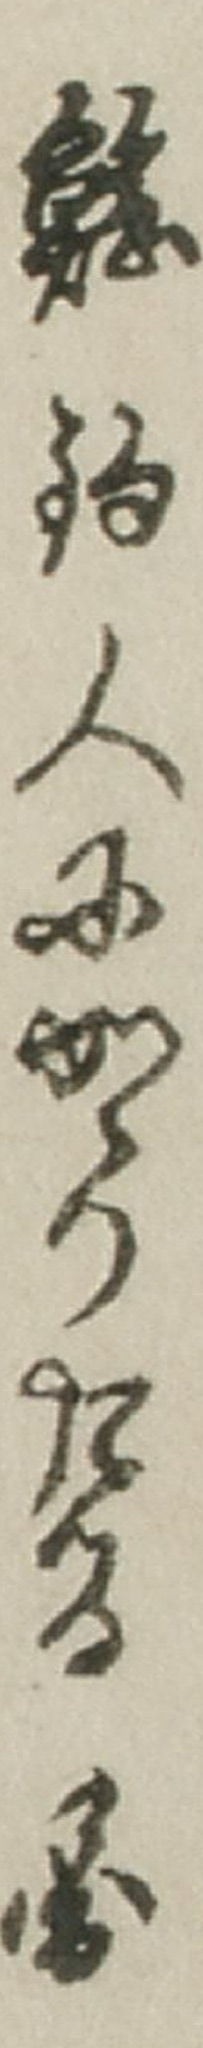鯰釣人にかゝりたる図
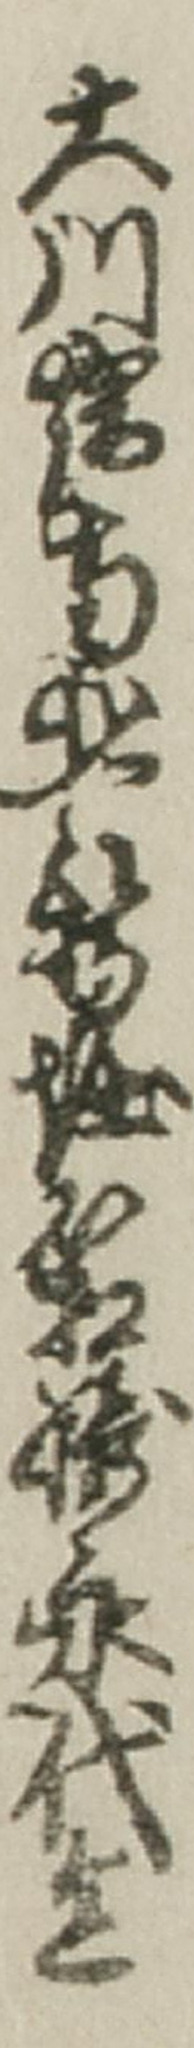弐大川端南北新堀箱崎永代辺
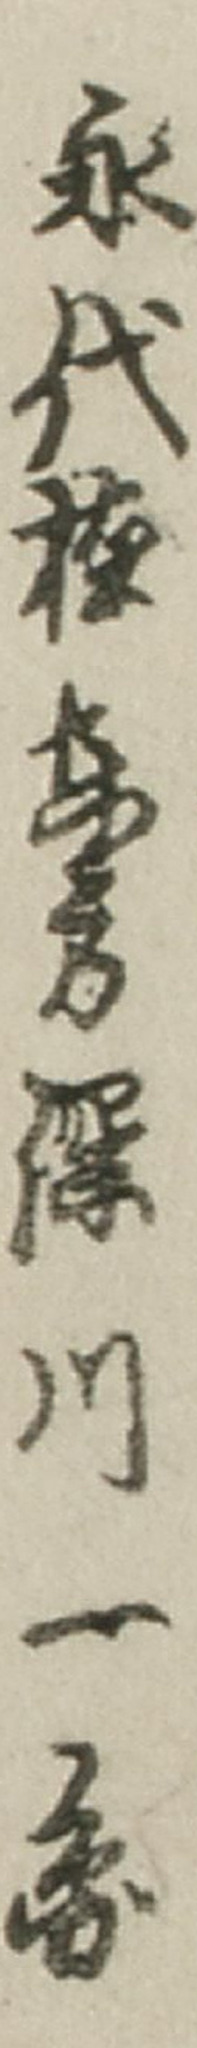三永代橋東方深川一円
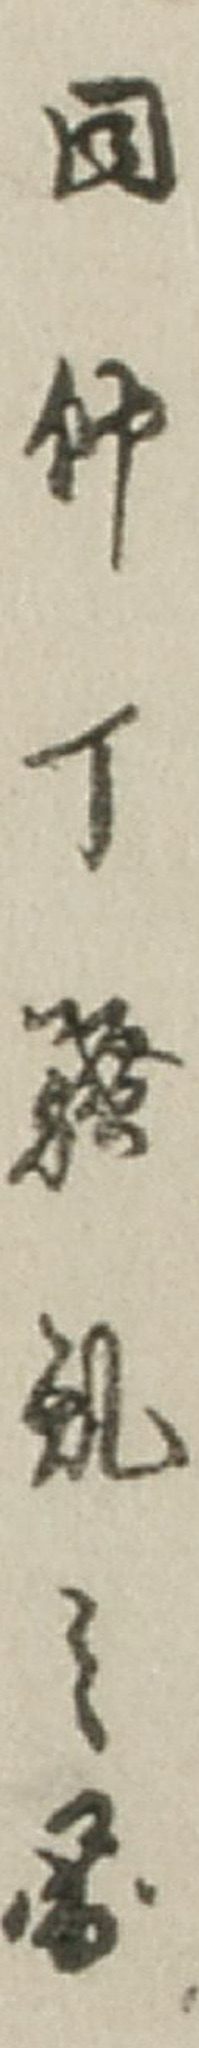同仲丁騒乱之図
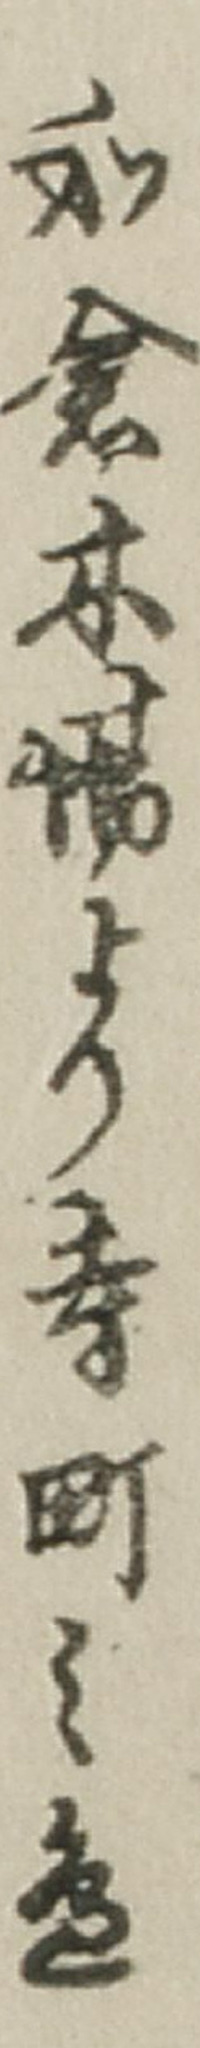四和倉木場より寺町之辺
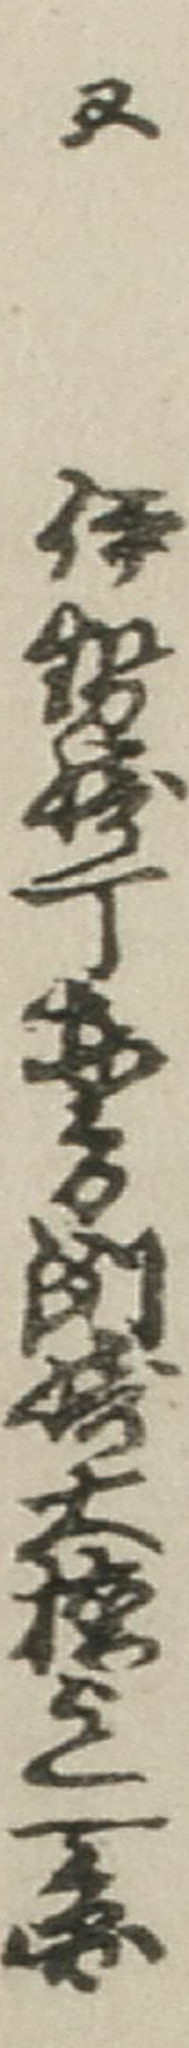五伊勢崎丁西方洲崎大橋迄一円
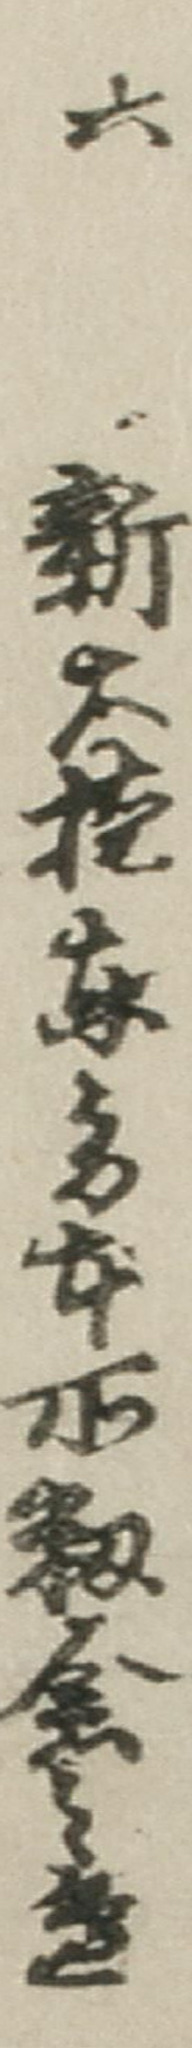六新大橋東方本所籾倉之辺
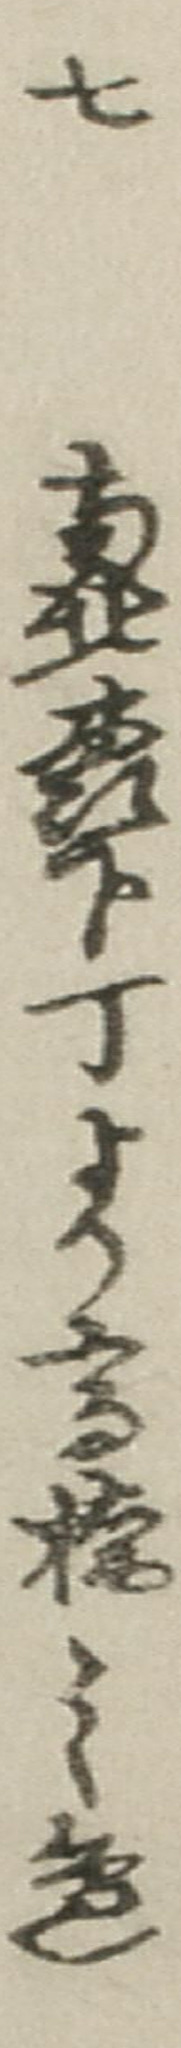七南北森下町より高橋之辺
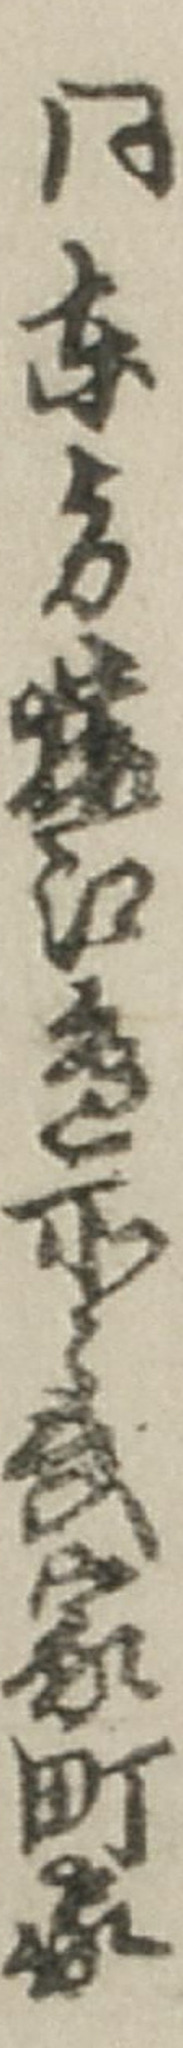八同東方横江辺所々武家町家
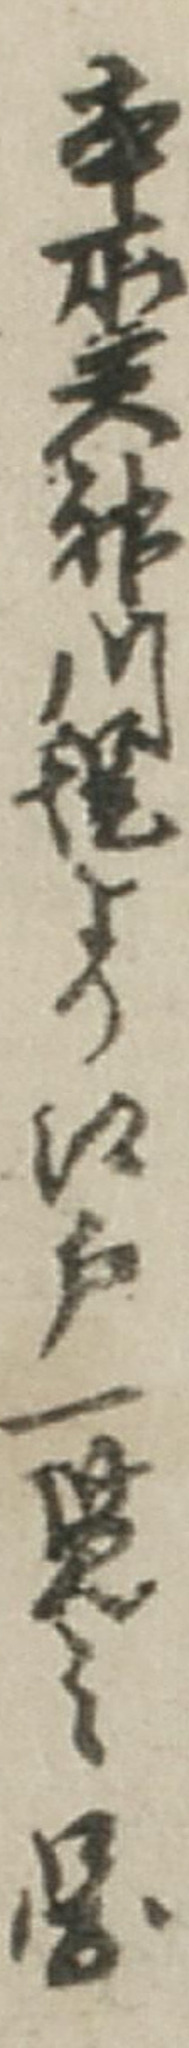本所天神川堤より江戸一覧之図
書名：安政見聞誌　上
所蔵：東京大学地震研究所図書室 Earthquake Research Institute Library, The University of Tokyo, JAPAN
